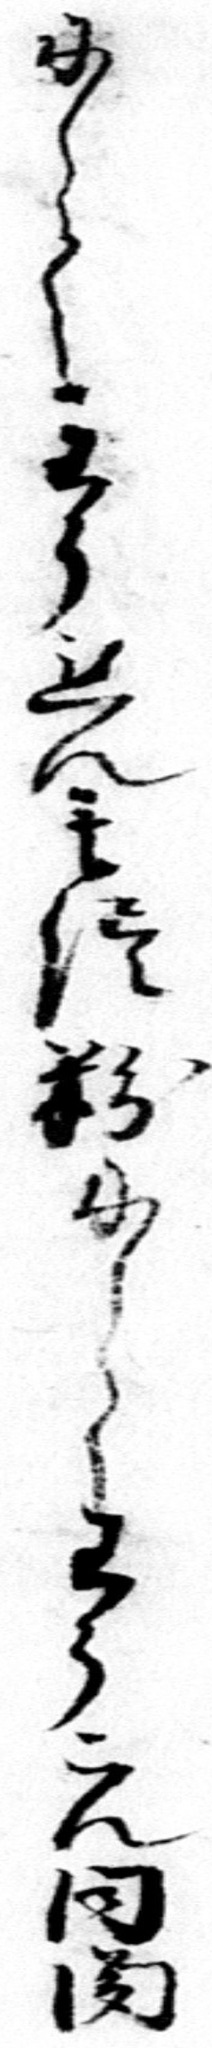にしてわうれん其儘粉にしてわうこん同肉
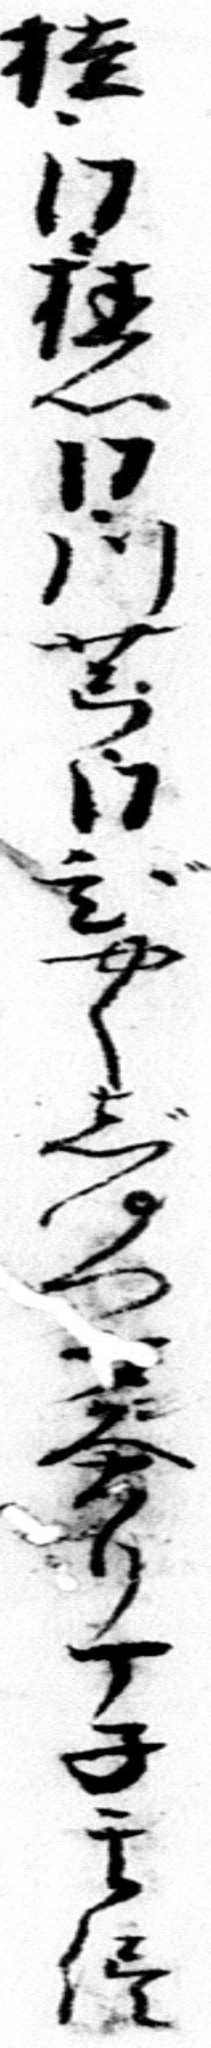桂同桂心同川芎同びやくじゆつ少々炙り丁子其儘
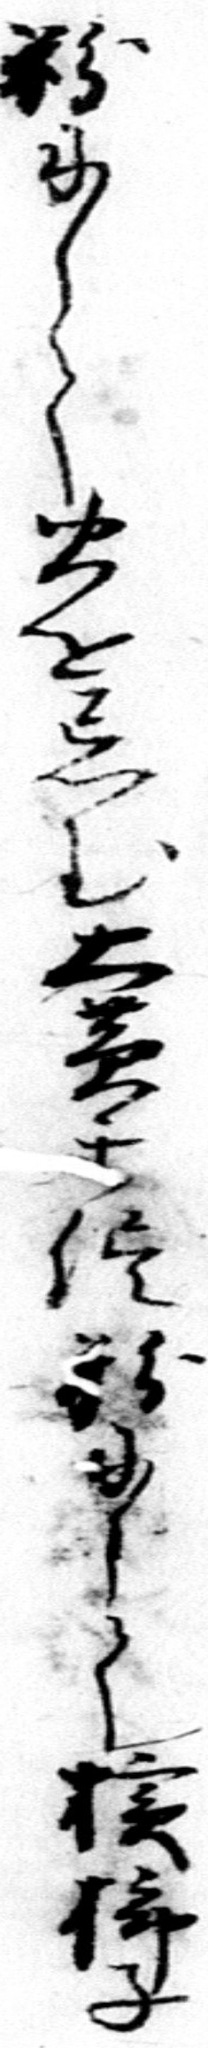粉にして火を忌む大黄其儘粉にして檳榔子
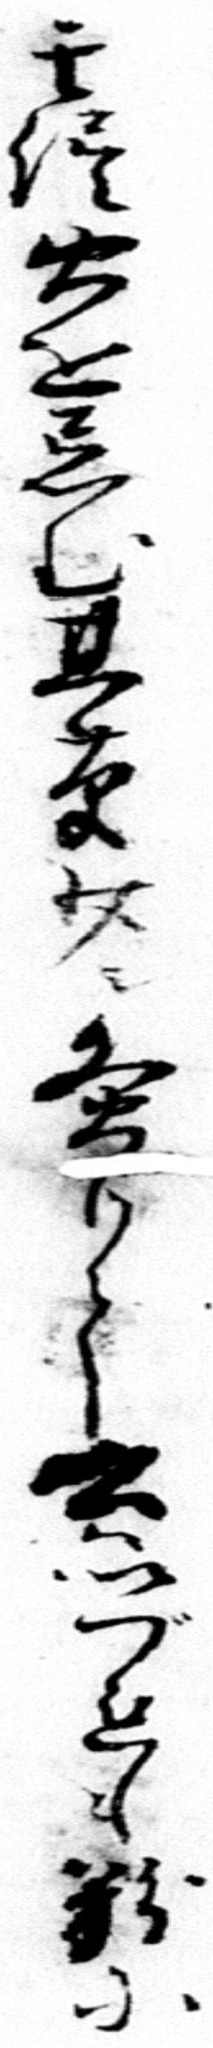其儘火を忌む甘草少々炙りて右はいづれも粉に
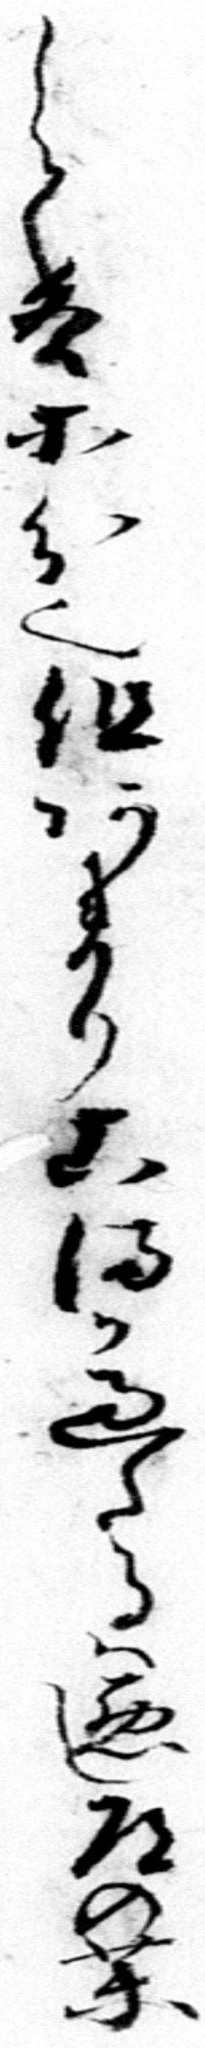して各等分也但あまりこまか過たるは悪し常の薬
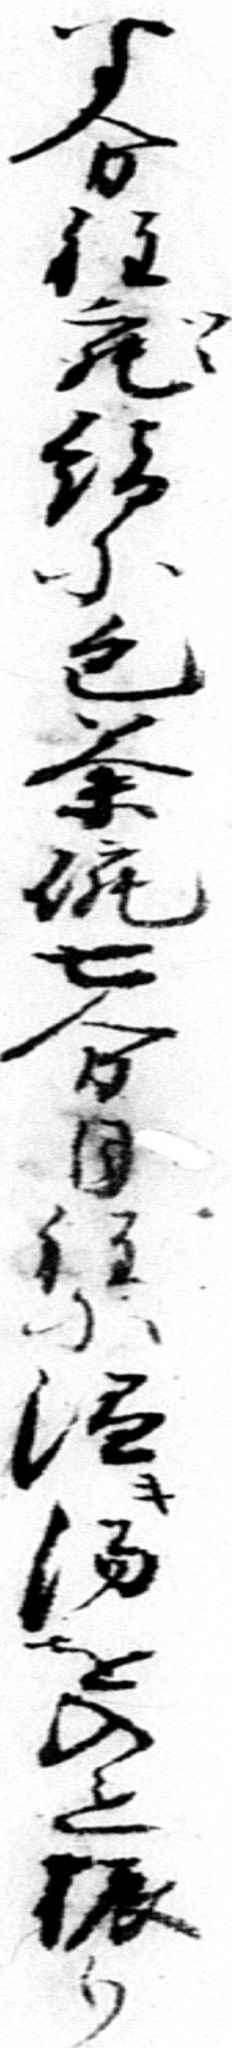半分程宛絹に包茶碗七分目程に温き湯を入れ振り
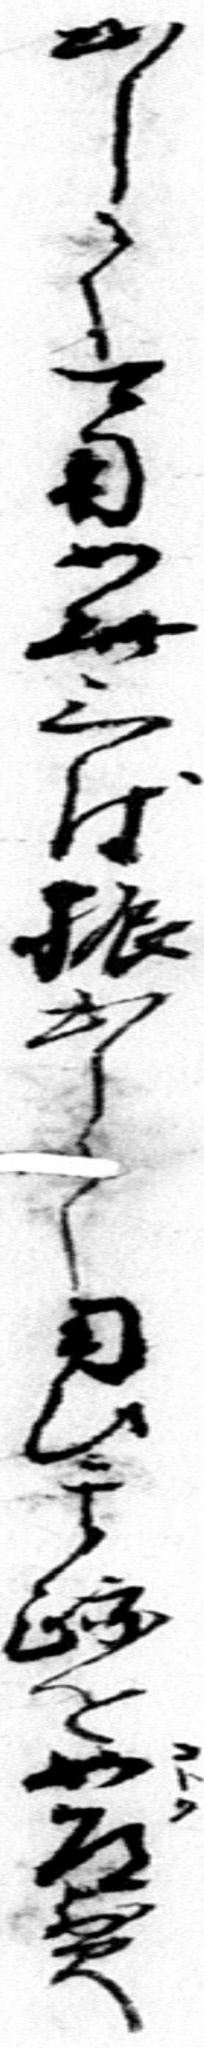出して可用如此三度振出して用ひ其跡を如常煎
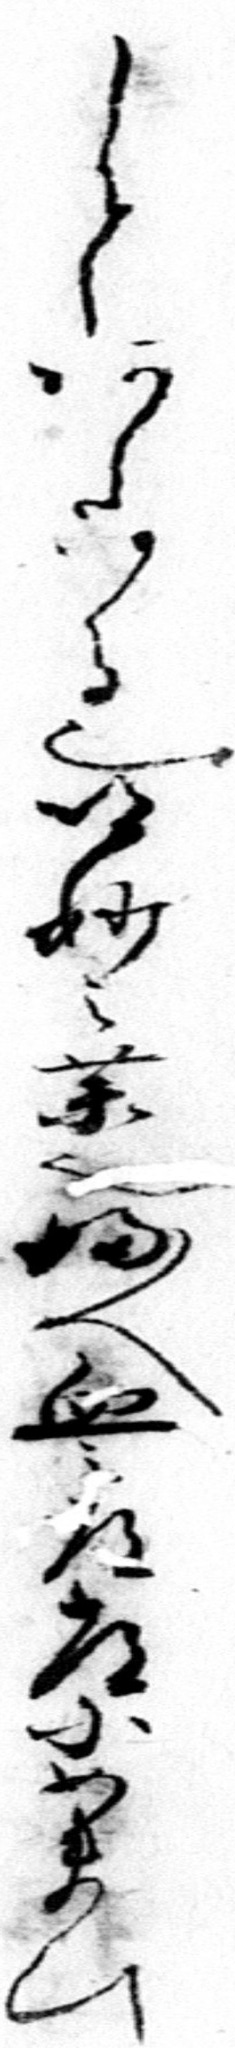してあたゆる也以妙の薬也婦人血の道常にめまひ
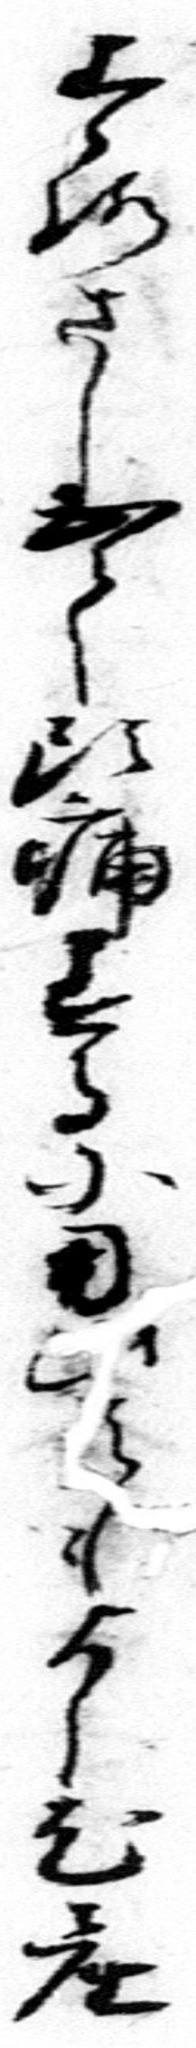こゝろさし出て頭痛するに用ひてもよし尤産
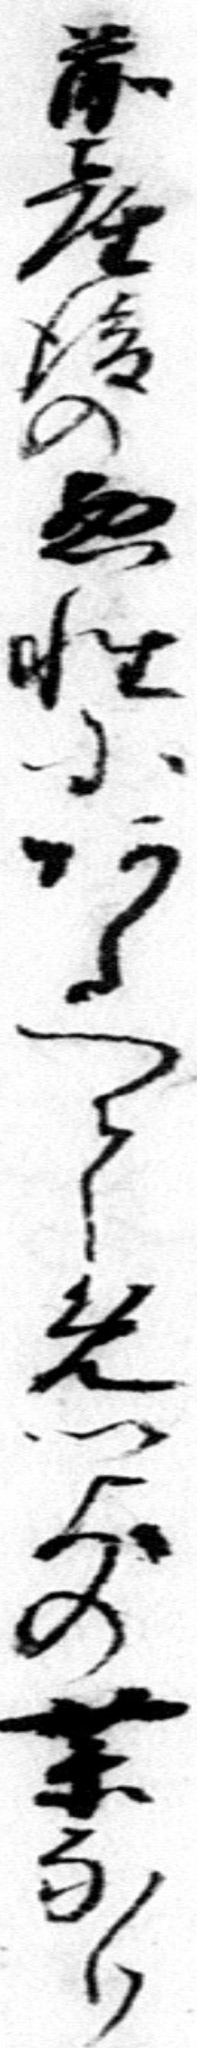前産後の悪性にあたへてめいよの薬なり
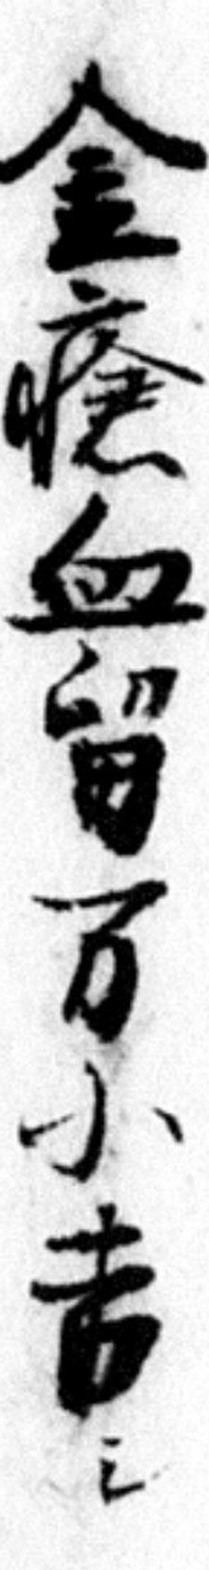金瘡血留万に吉し
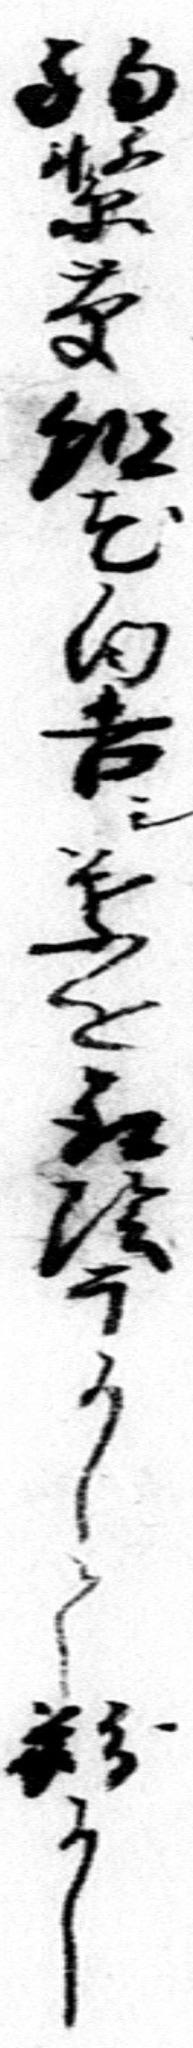駒繋草但花白吉し葉を取陰干にして粉にし
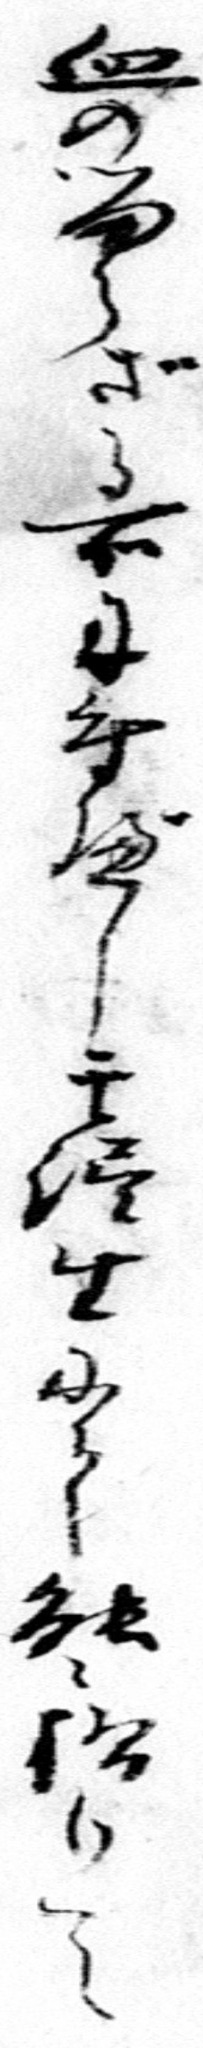血の留らざる所に付べし其儘生にて能々摺りて
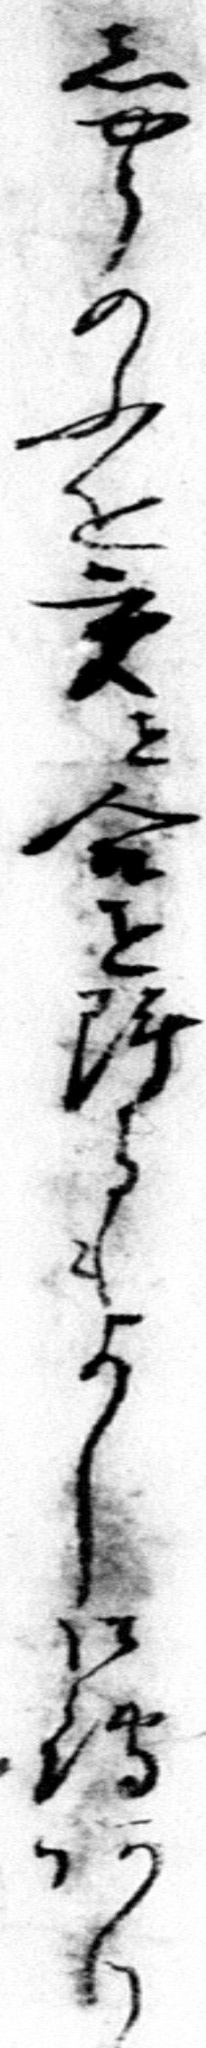しやうのふ交せ合せ附るもよし口伝あり

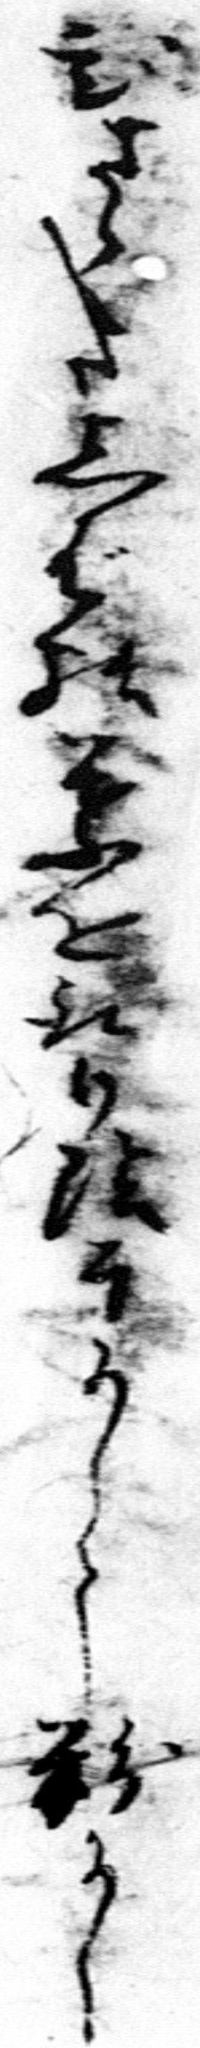ひさらきしばの葉を取り陰干にして粉にし
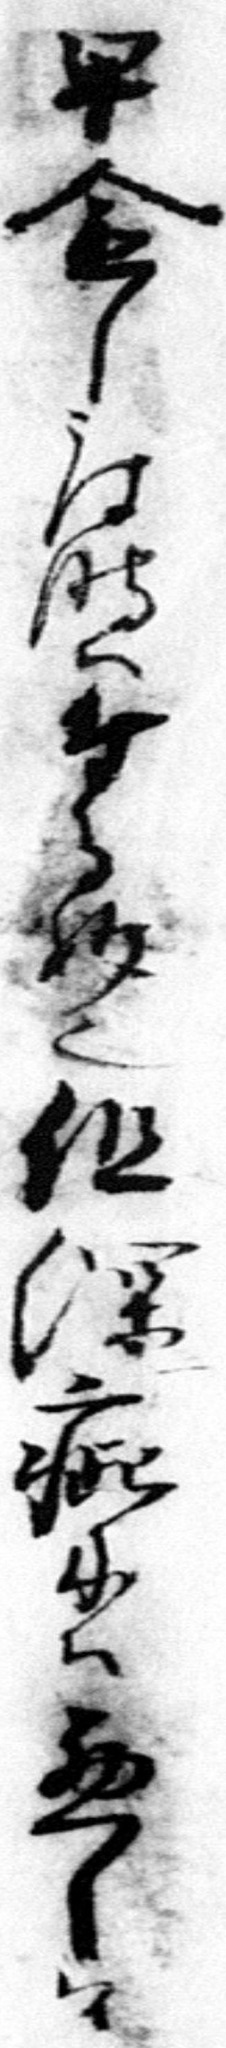早愈し度時は付る粉也但深疵には悪し
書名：名薬秘伝之書
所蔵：徳島県立図書館
